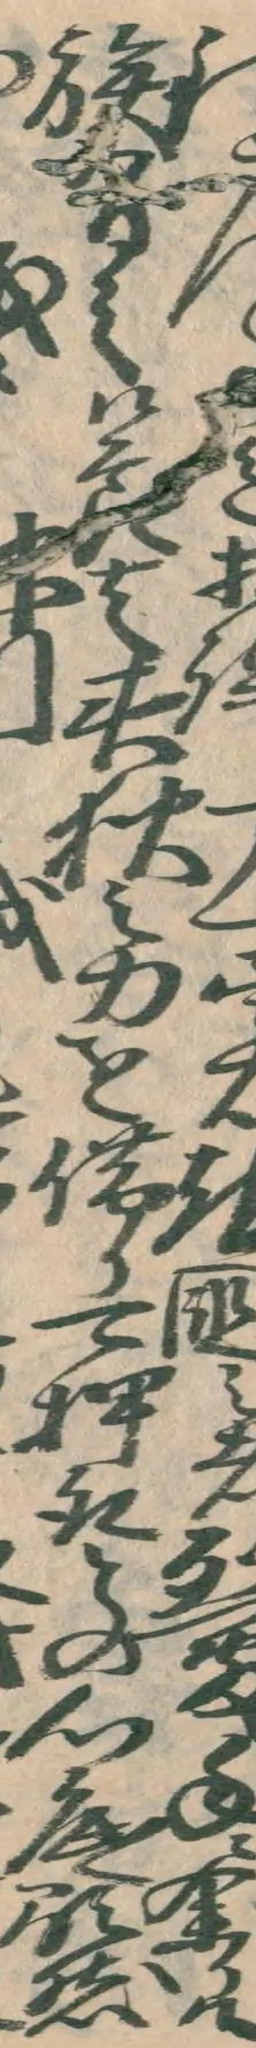族有之候節者夷狄之力を借り可押取との心底顕然
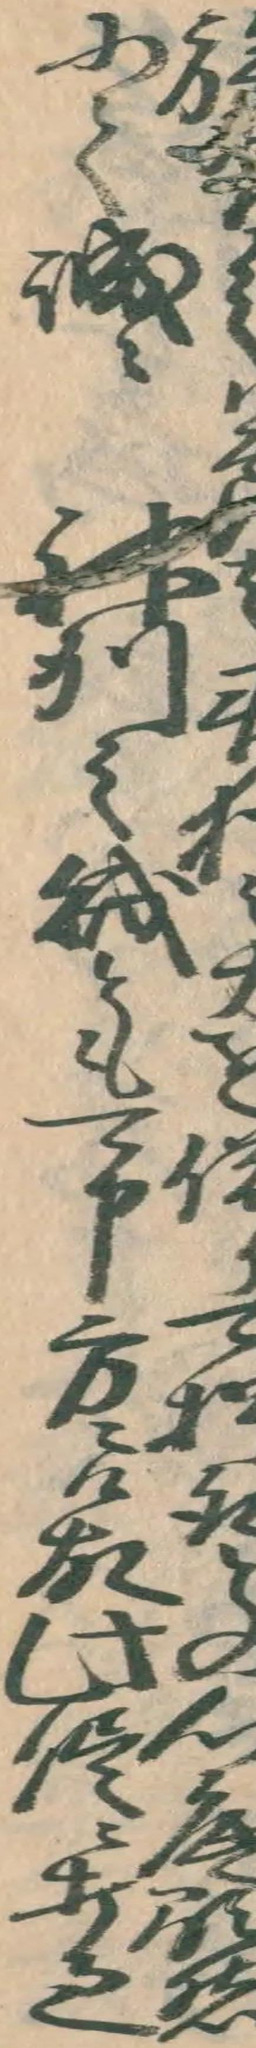にて誠ニ神州之賊とも可申方ニ候故此儘ニ打過

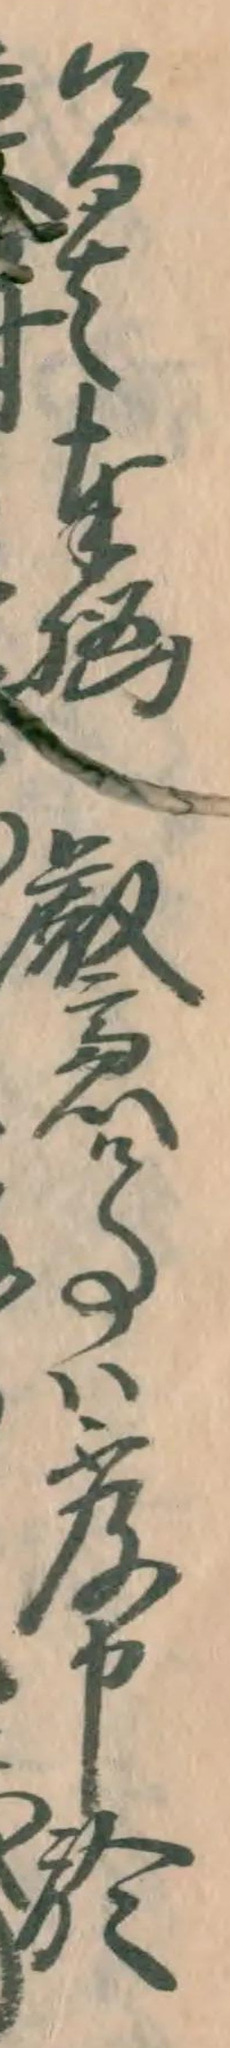候而者奉悩叡慮候事ハ不及申於
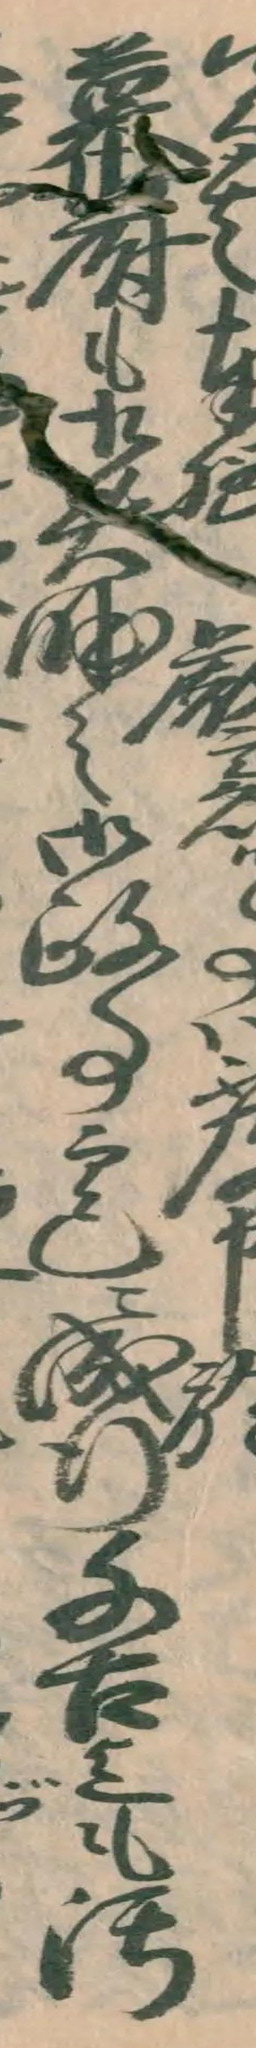幕府も御失体之御政治而已ニ成行千古迄も汚
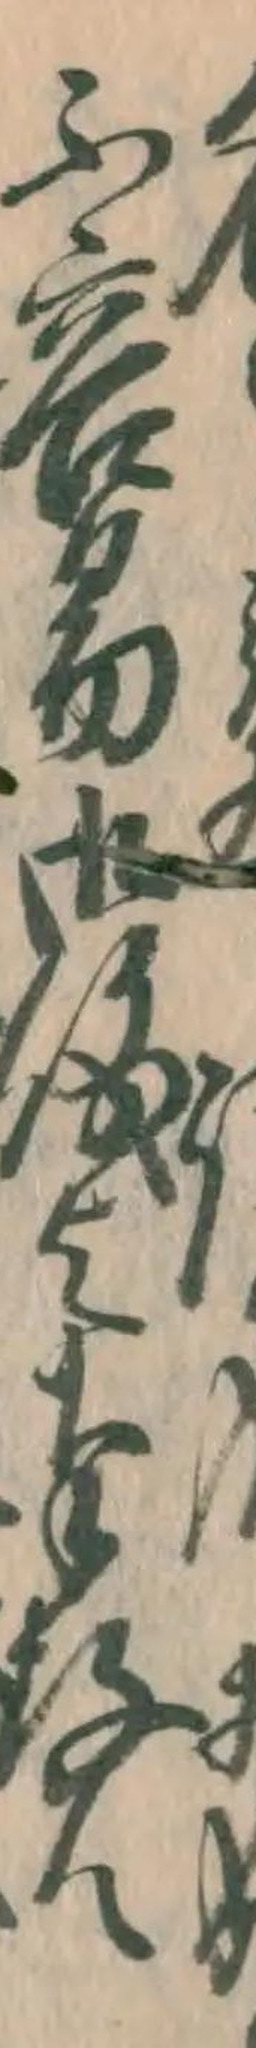不容易御儀と奉存候
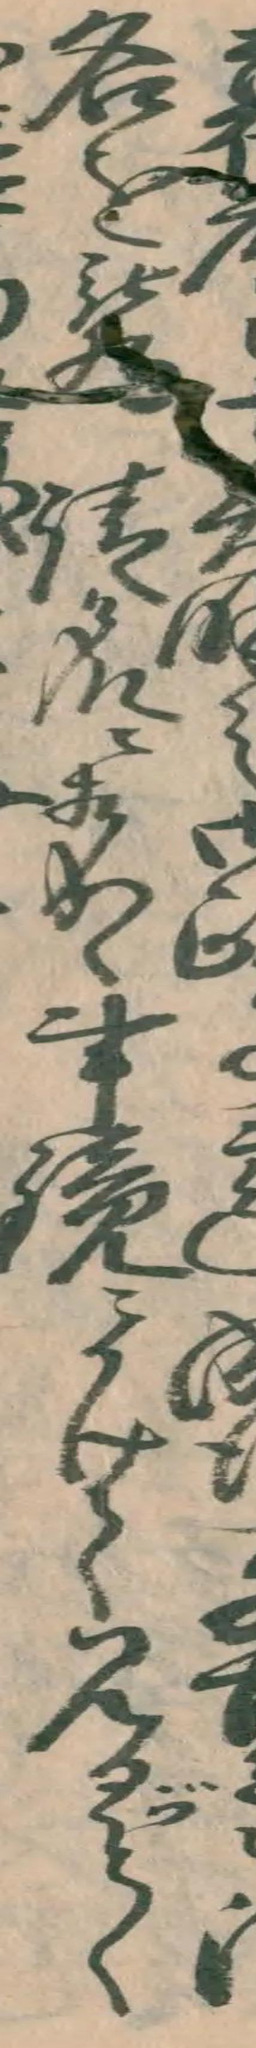名を被為請候様ニ相成候事鏡ニかけて見るがことく
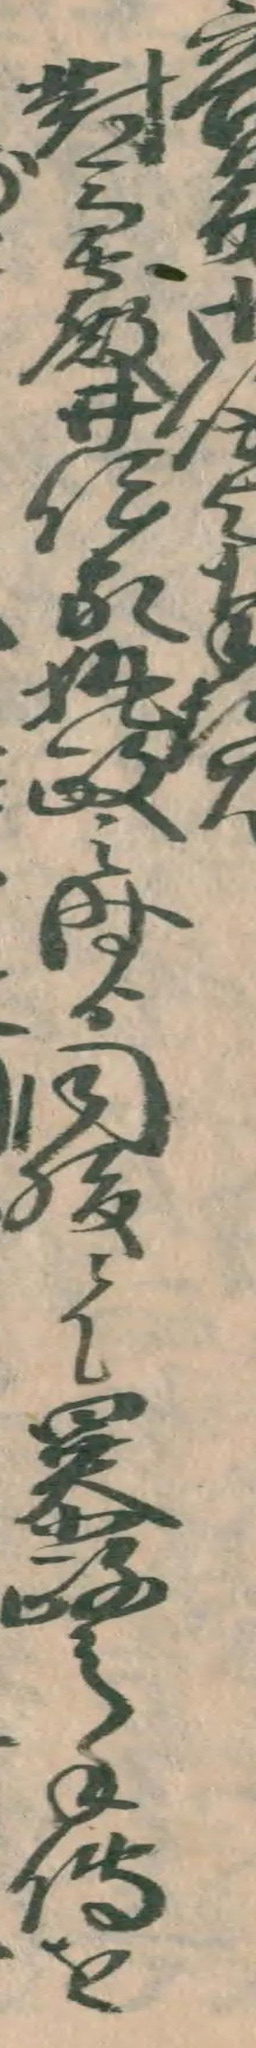對馬守殿井伊家執政之時ゟ同腹ニて御暴政之手傳を
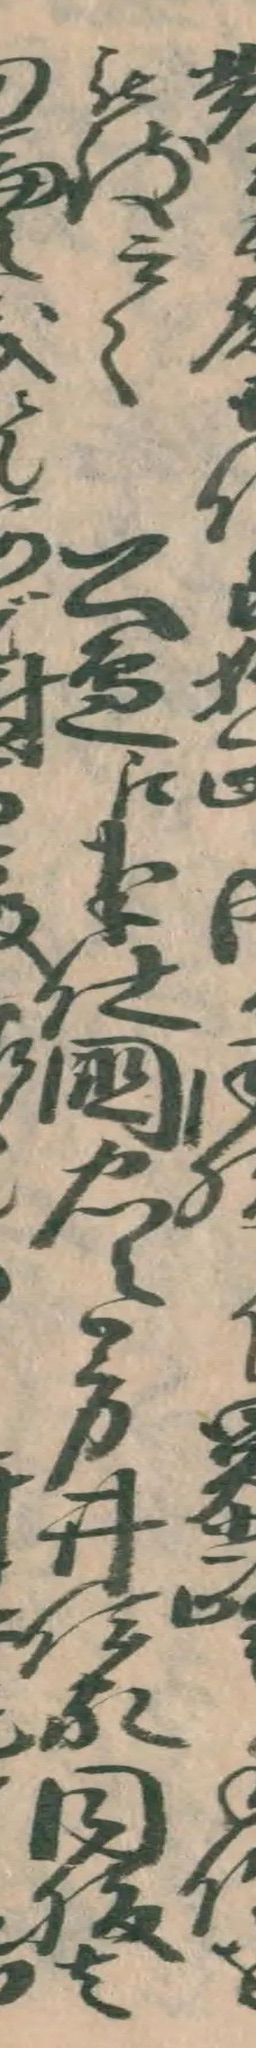被致云々公邊江奉仕国忠之御方井伊家同腹者
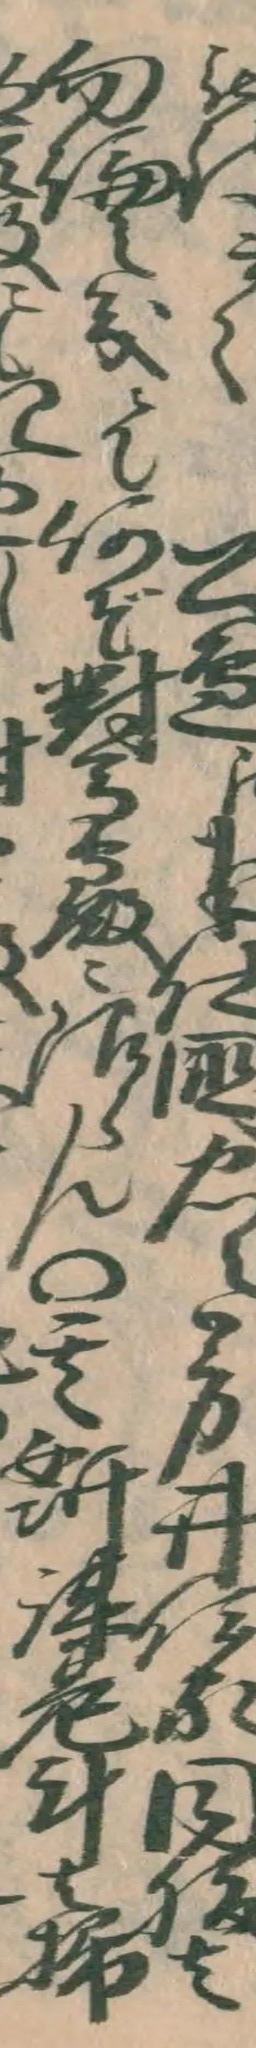勿論之義ニて何ぞ對馬守殿ニ限らん○其姧謀危計者掃
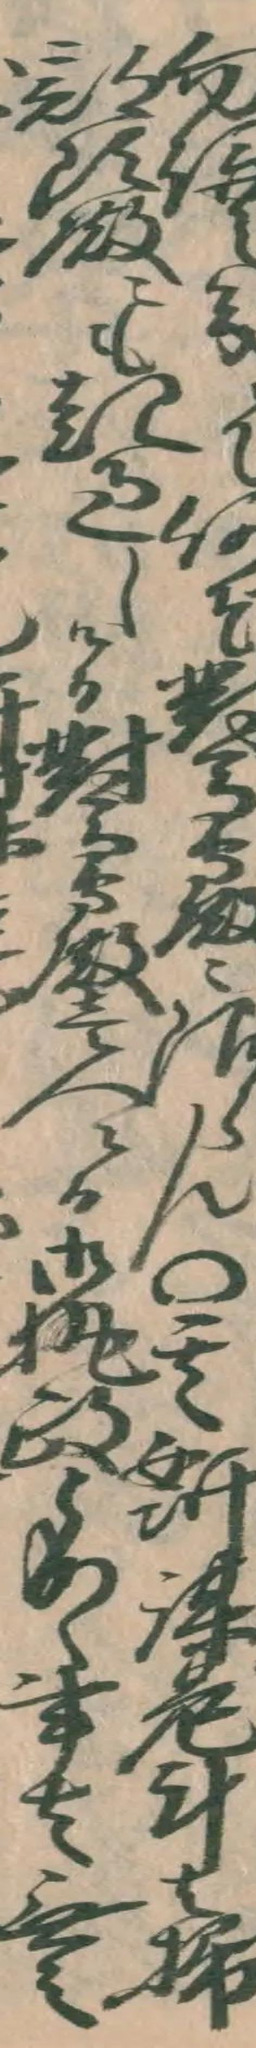部頭殿ニも起過し候而對馬守殿壱人ニ而御執政被成候事者無之
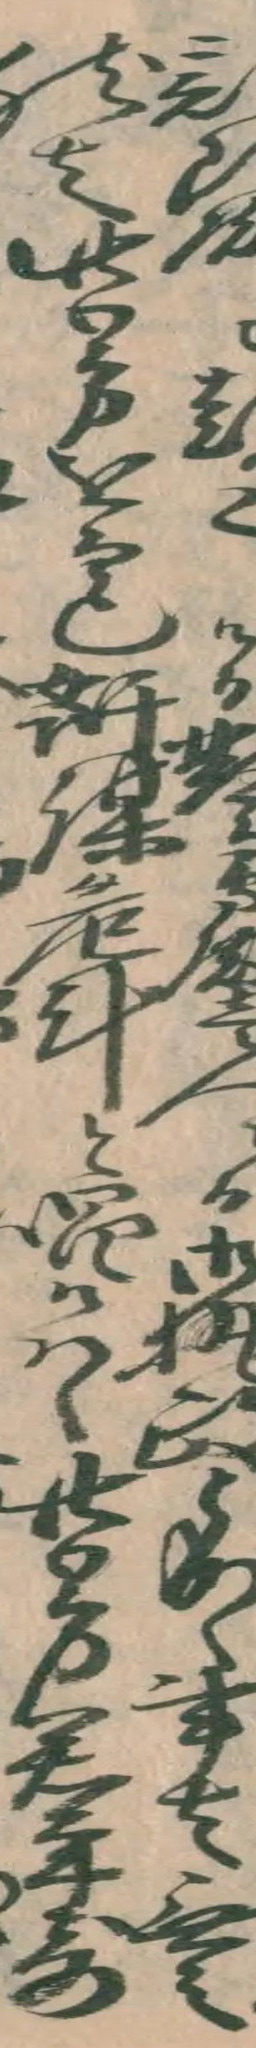然者此御方を而已姧謀危計と唱候ハヽ此御方若年寄
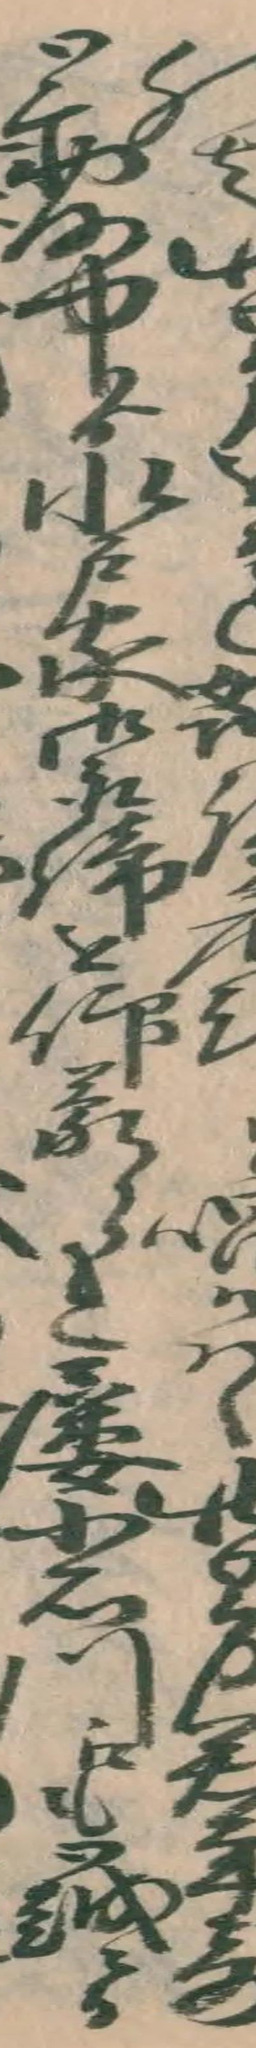御勤殿中ゟ水戸家御取締を仰蒙られ屢小石川江も御越ニ而
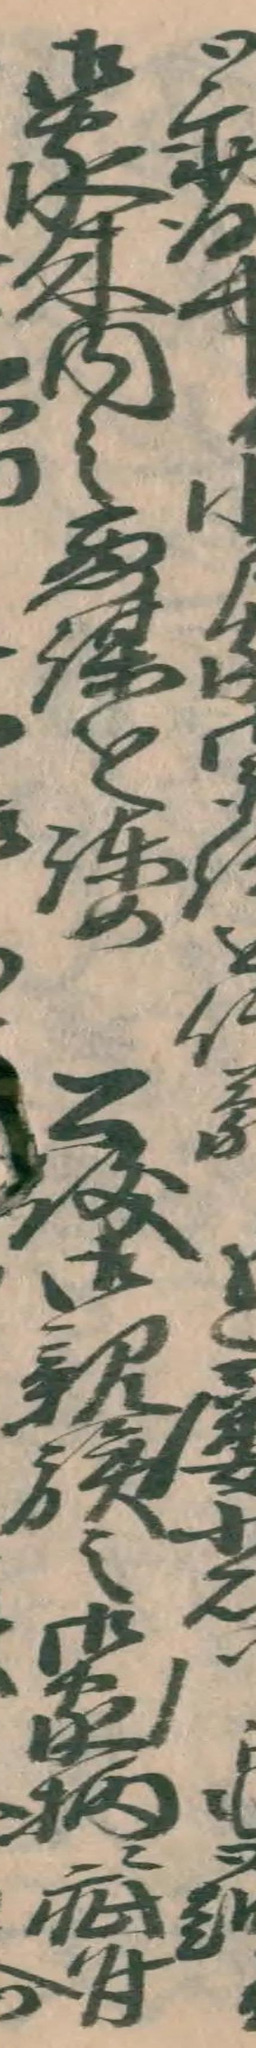御家来内之悪謀を諫め公儀御親族之御家柄ニ疵付
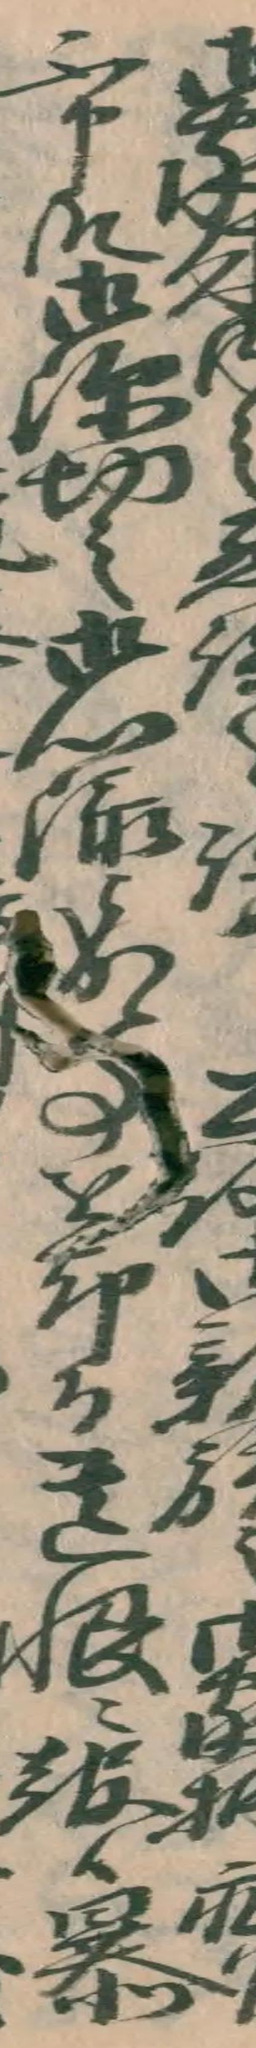不申様御深切之御心添被成候事を却而遺恨ニ報候暴
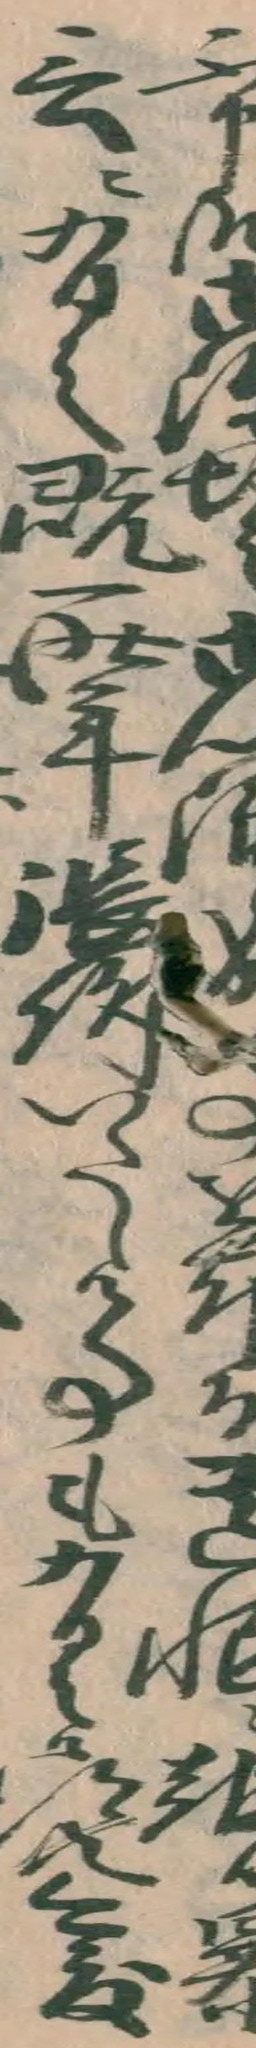言ニ有之既一昨年張訴いたし候事も有之候得共今度
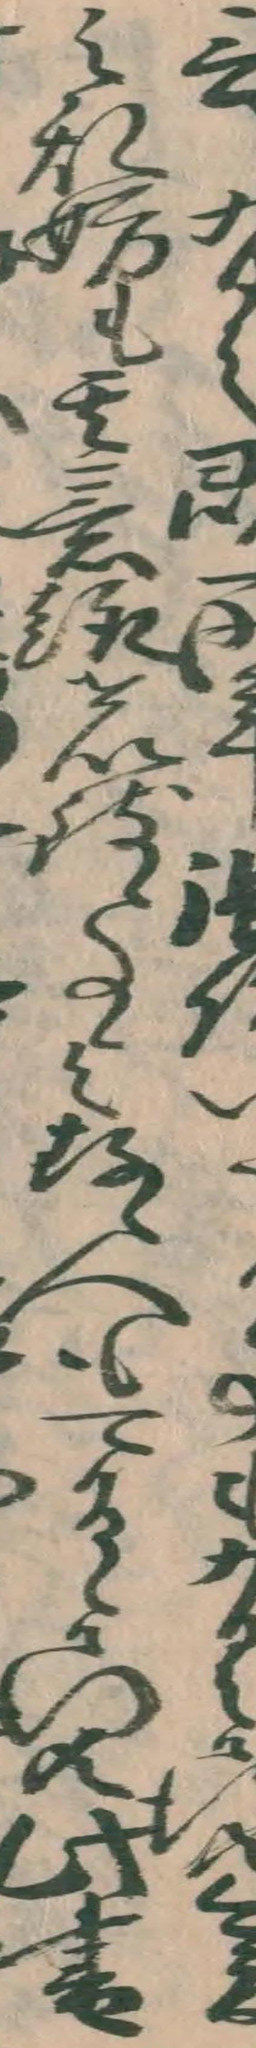之乱妨も其意趣を以致候事と存候人も可有之候得共此書
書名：麗斎叢書. 20
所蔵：国立国会図書館 National Diet Library, JAPAN
